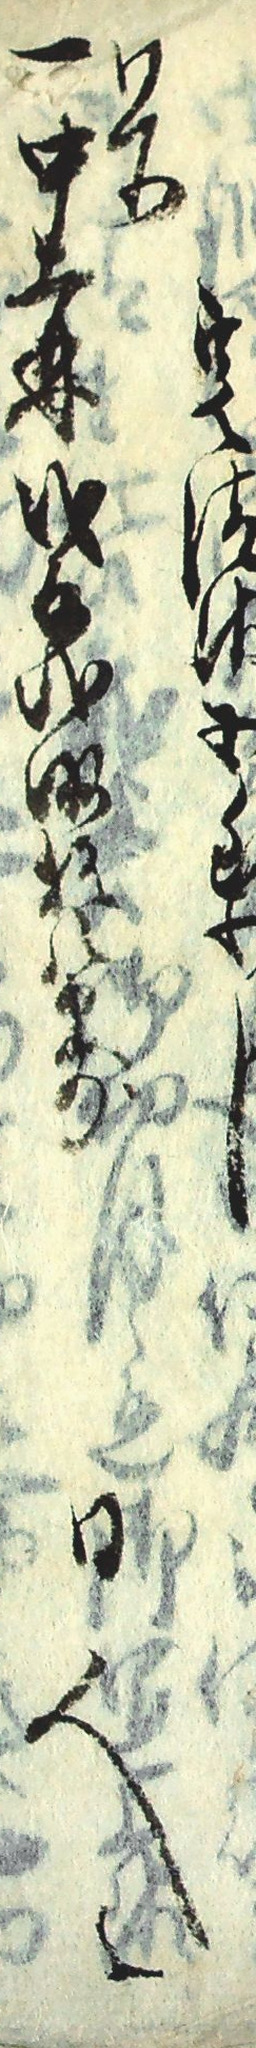一中上林弐反弐畝拾八歩
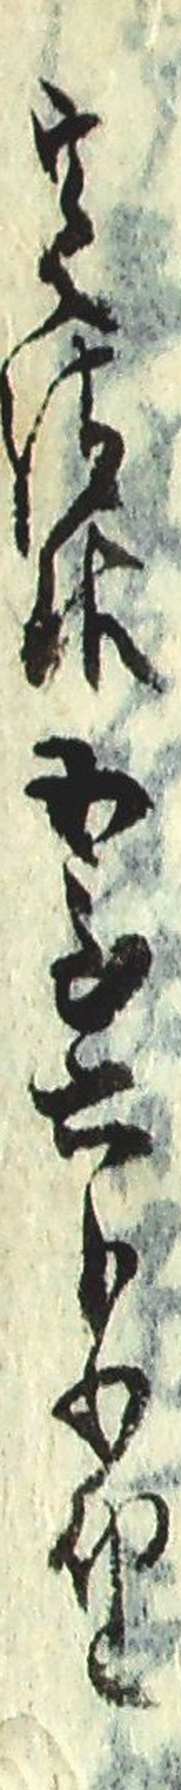定請銀五匁六分五厘

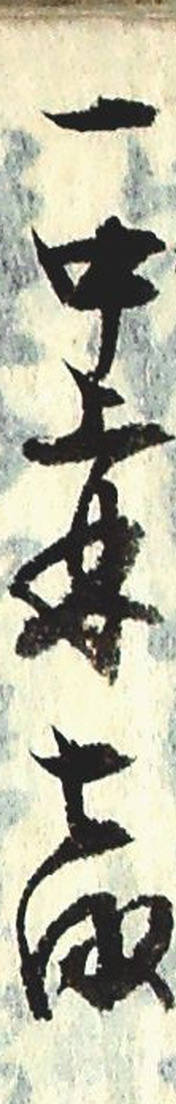一中上林七畝
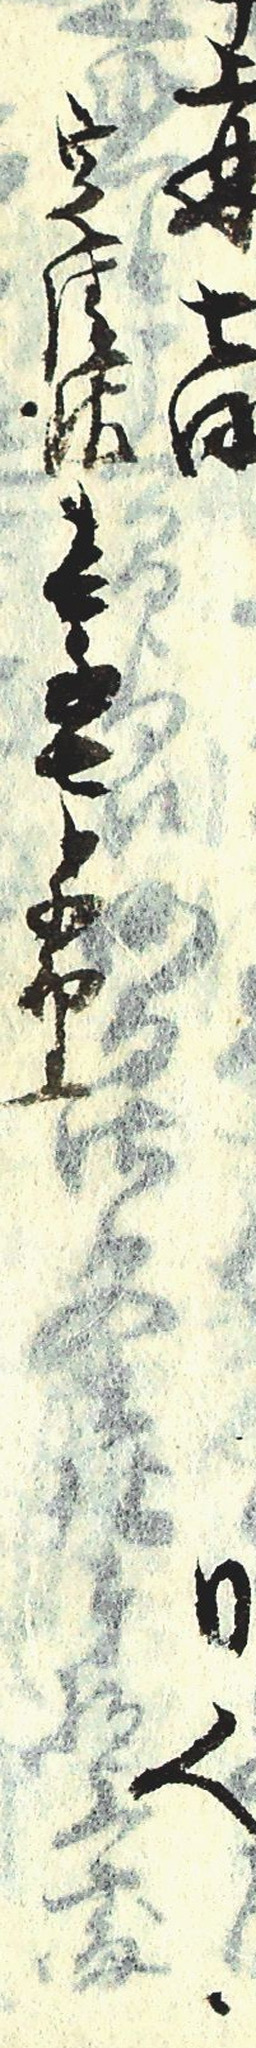定請銀壱匁七分五厘
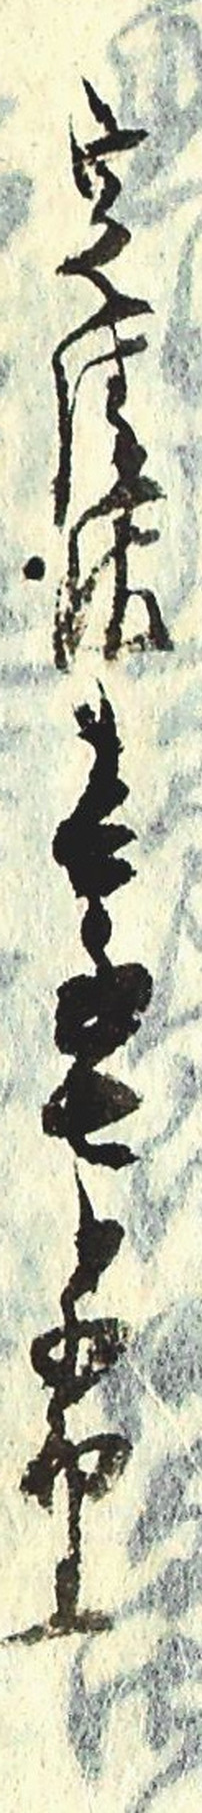定請銀壱匁七分五厘
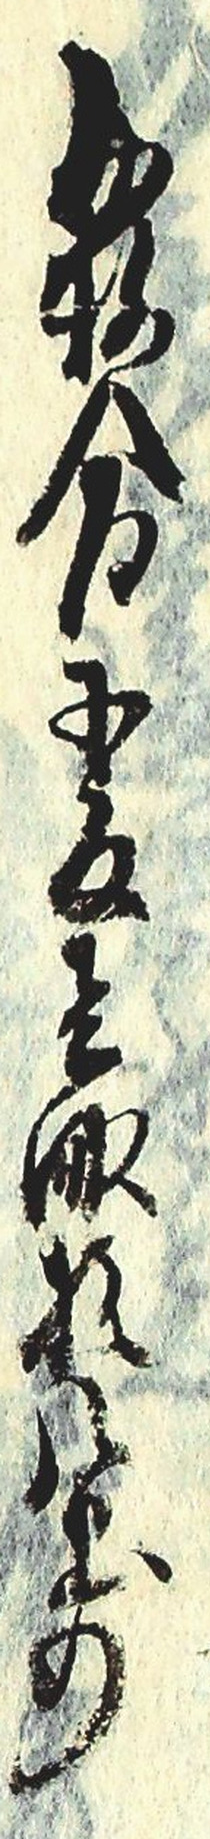反数合五反壱畝拾八歩
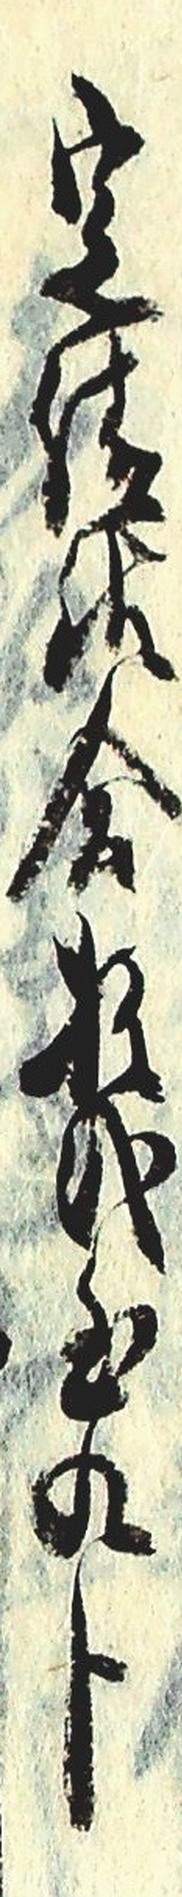定請銀合拾弐匁九分
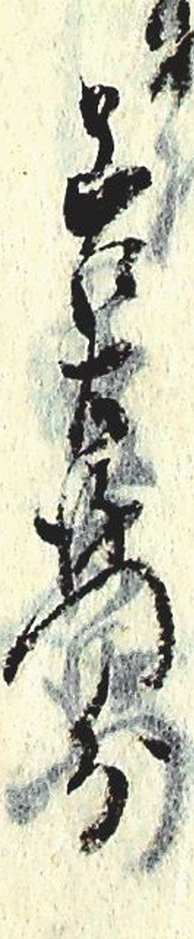善右衛門分
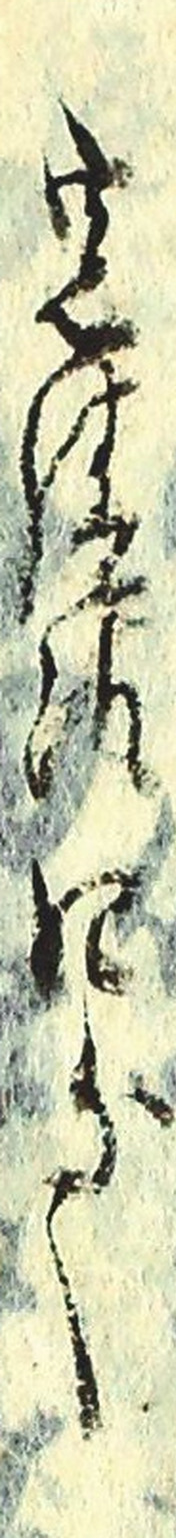定請銀四匁
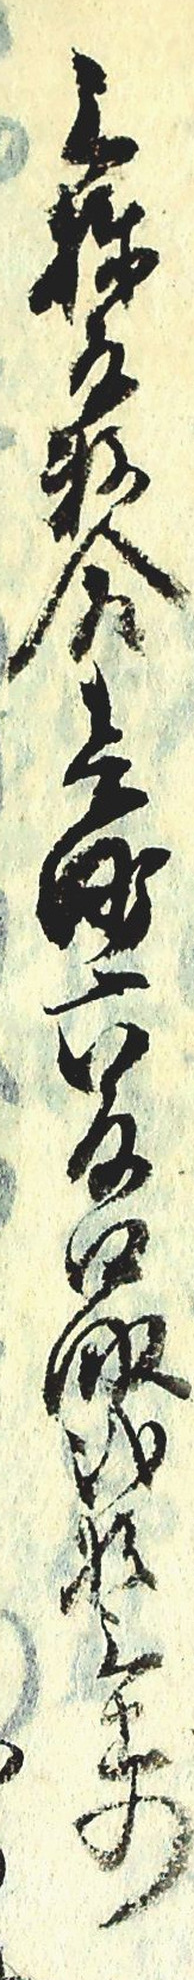三株反数合壱町六反四畝弐拾三歩
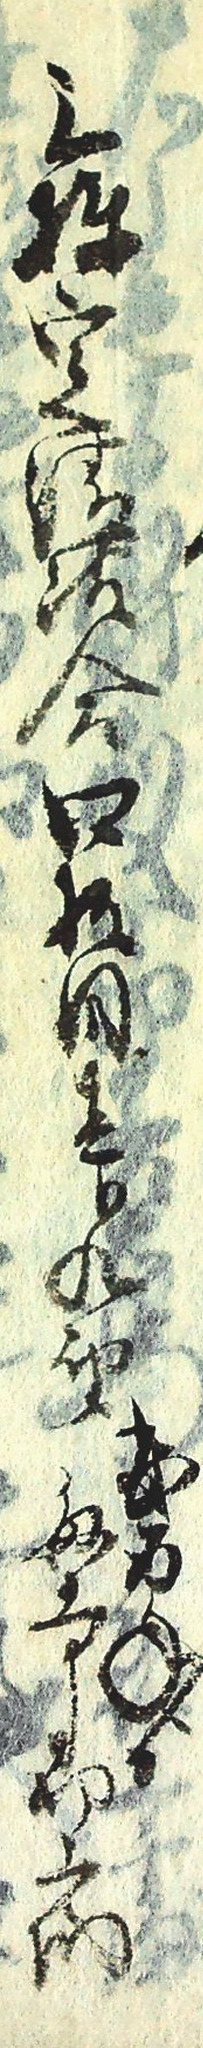三株定請銀合四拾目壱分九厘当酉年ゟ
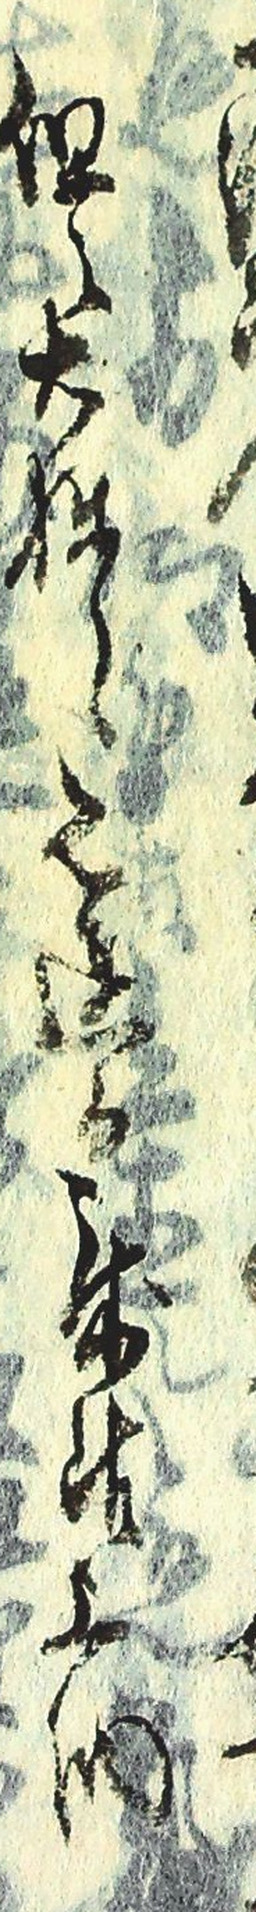但し右株に見逢て床銀上納
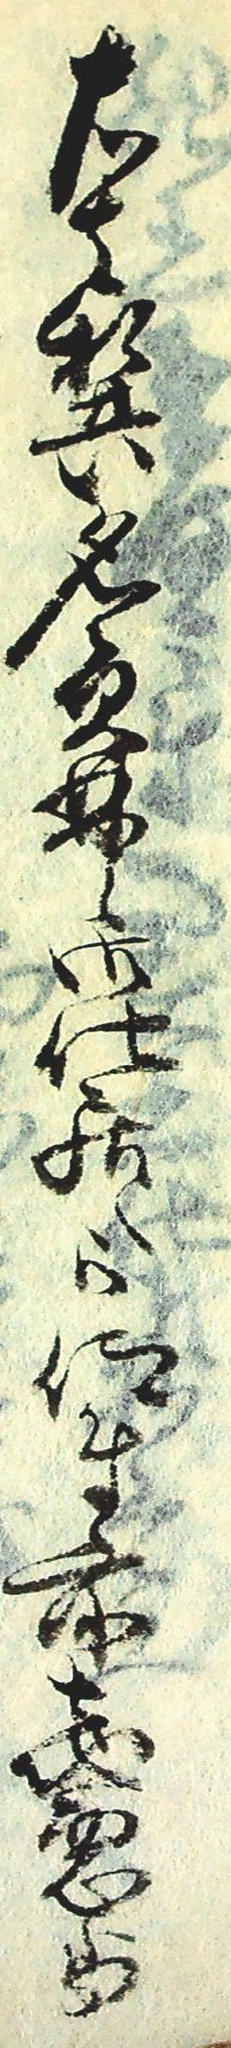右は私共名負林之御仕居へ被仰付候所土地悪布
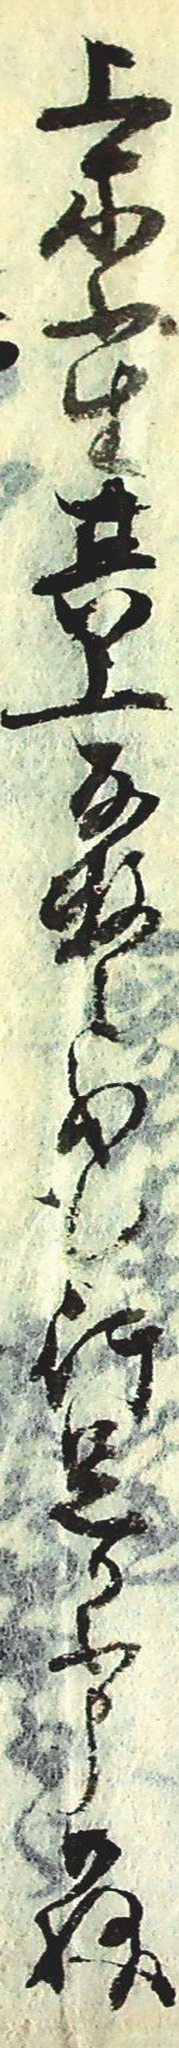上木不生其上反数之義も行足り不申候様
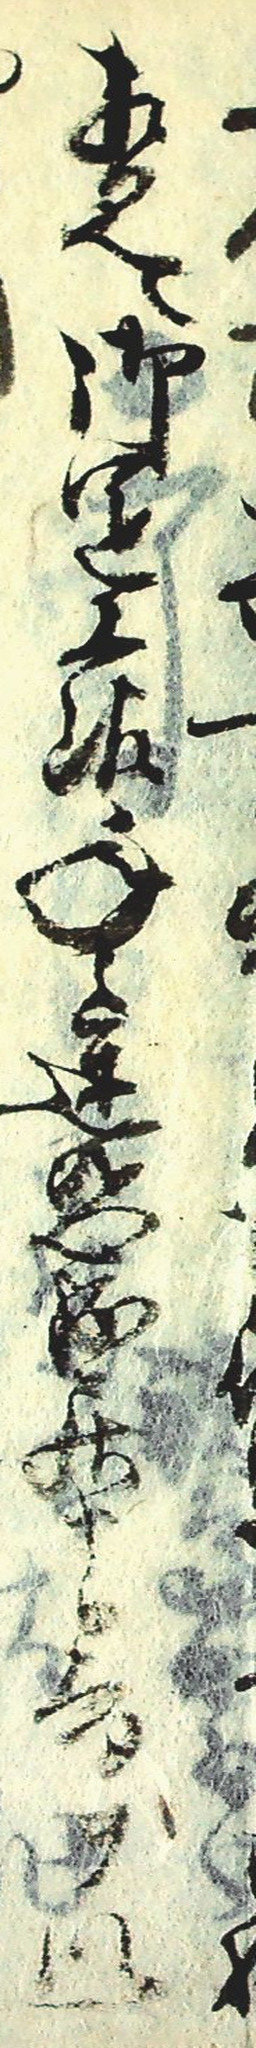相見へ御運上銀年々迷惑成居申候旨を以
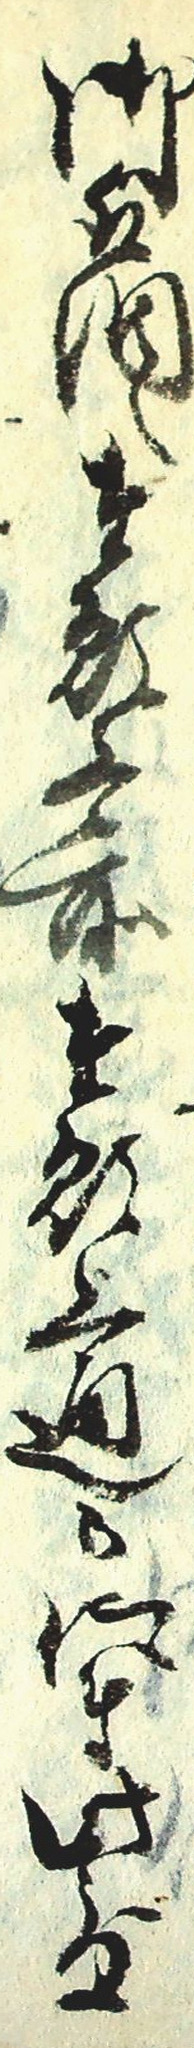御取調へ奉願上候所奉願上通被仰付此度
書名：諸御願書控(弐番）
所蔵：鳴門教育大学 Naruto University of Education
